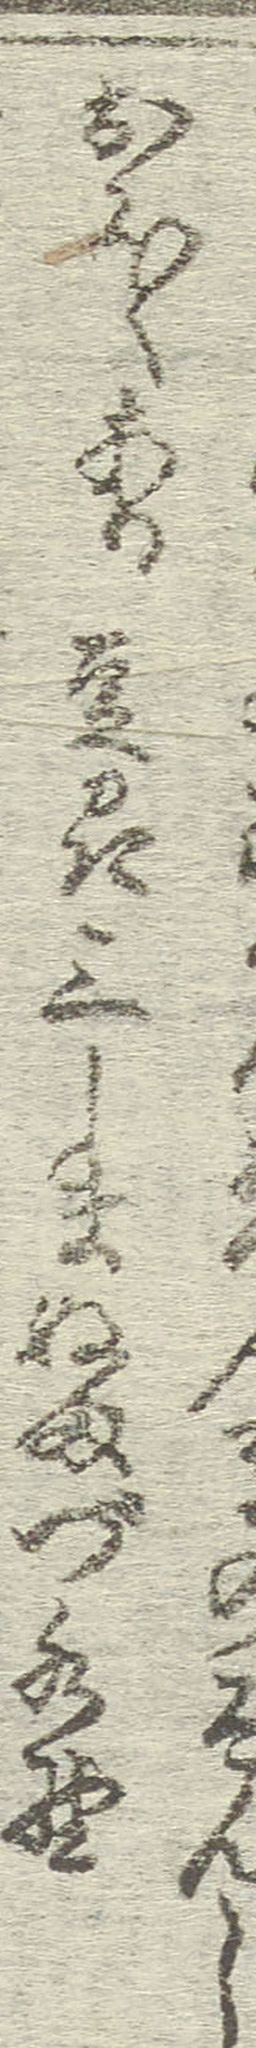おふくあり豆州三しまぬまづ水野
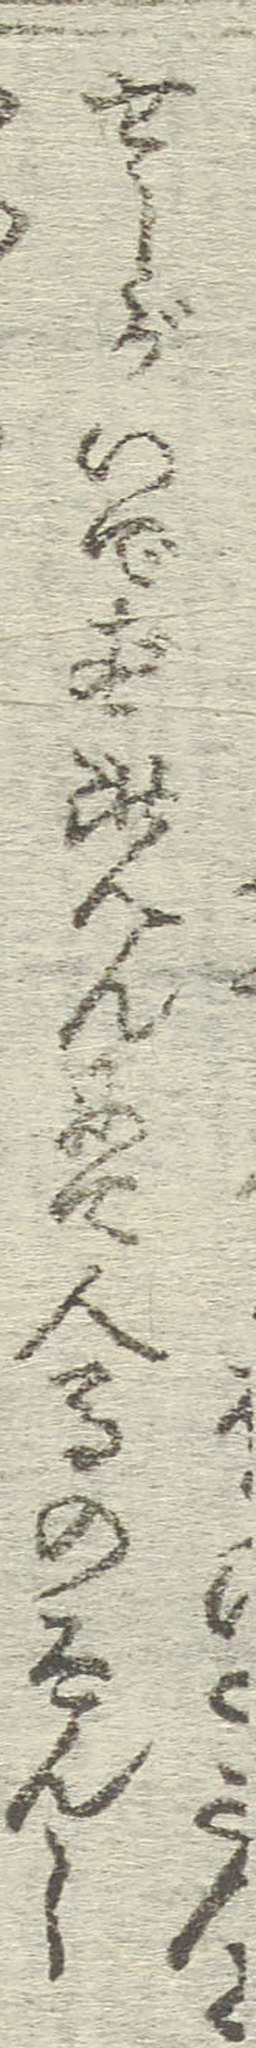せしがいでず此へんにて人馬のそんし
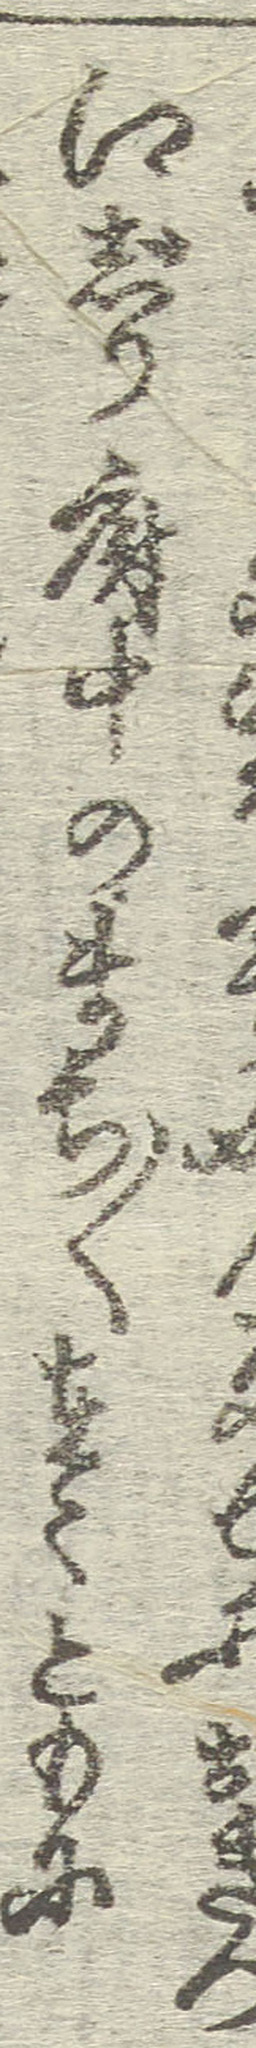江じり府中のまち〳〵在々ともに
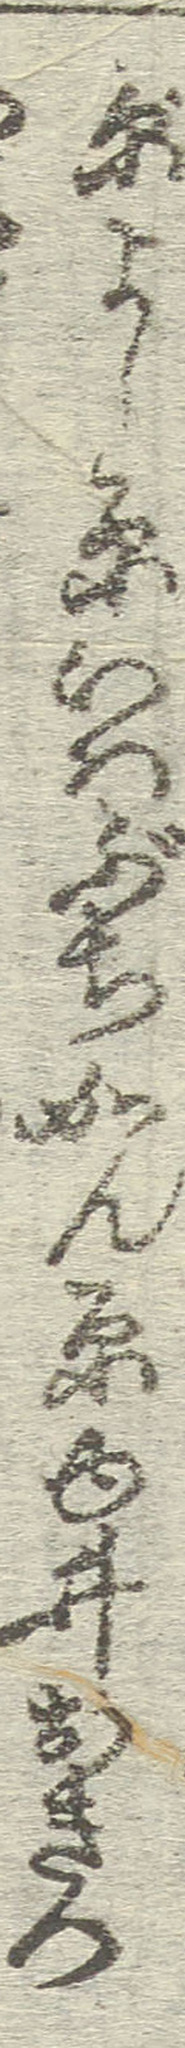原よし原いはぶちかん原ゆ井おきつ
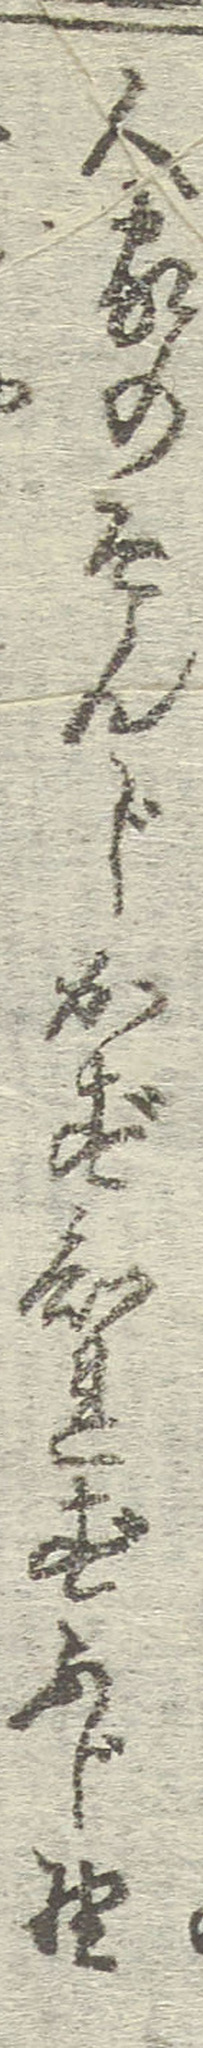人家のそんじかず知れずふじ野
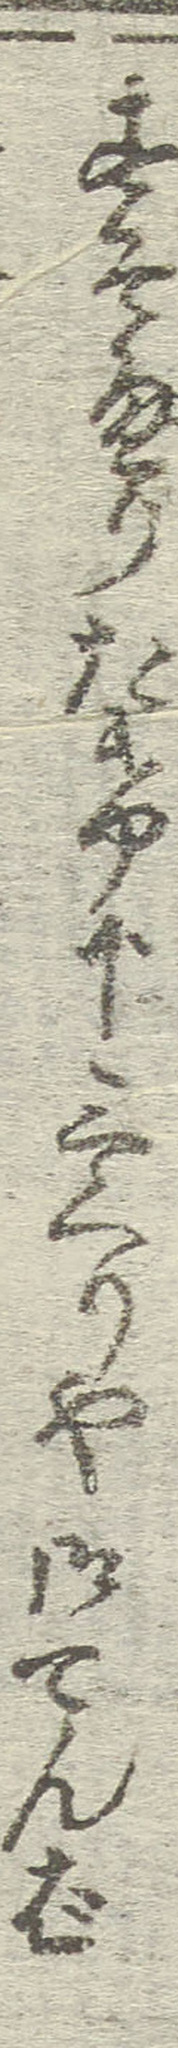すそ通りたけ下三くりや御てんば
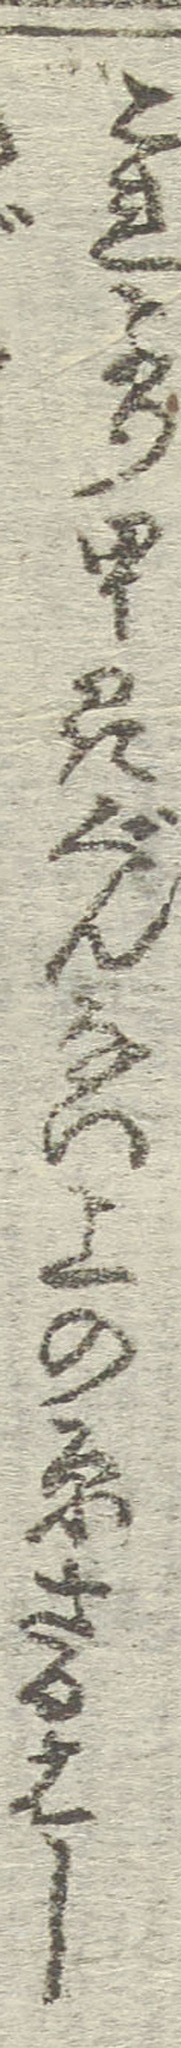これより甲州ぐんない上の原さるはし
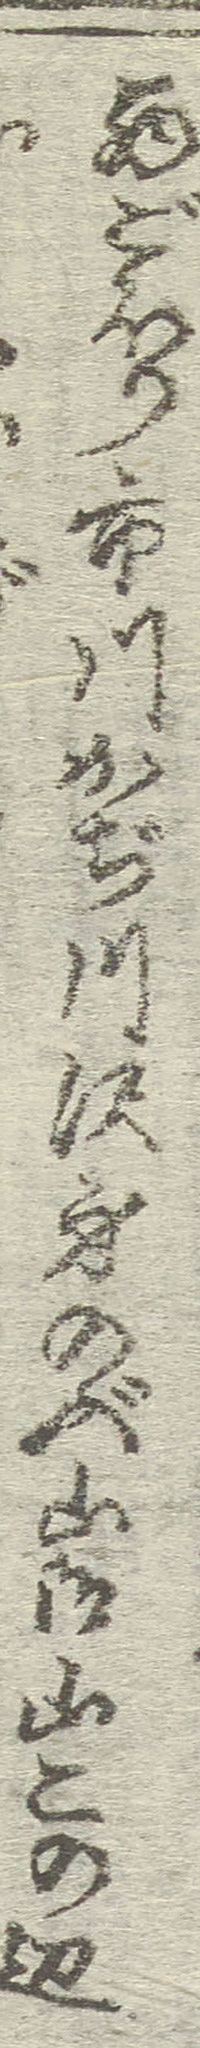西ごほり市川かぢ川沢身のぶ山御山この辺
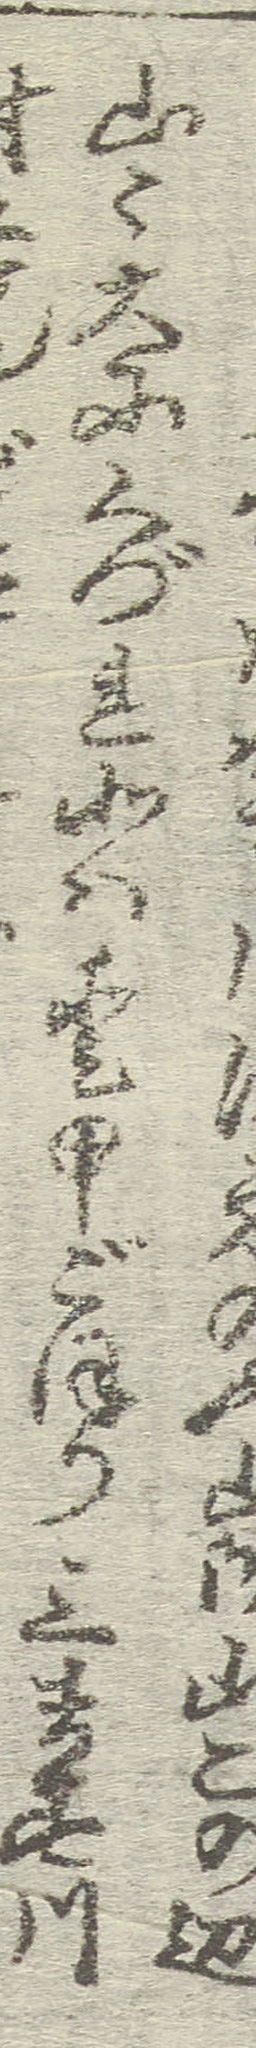山々大にくづれ北は愛甲ごほり三ます川
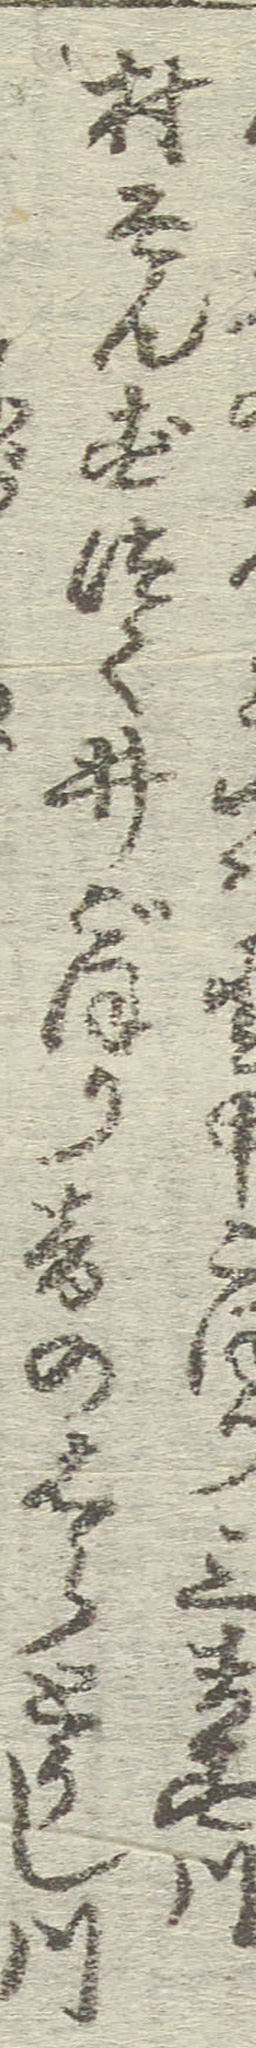村そんずつく井ごほり青のはらとうし川
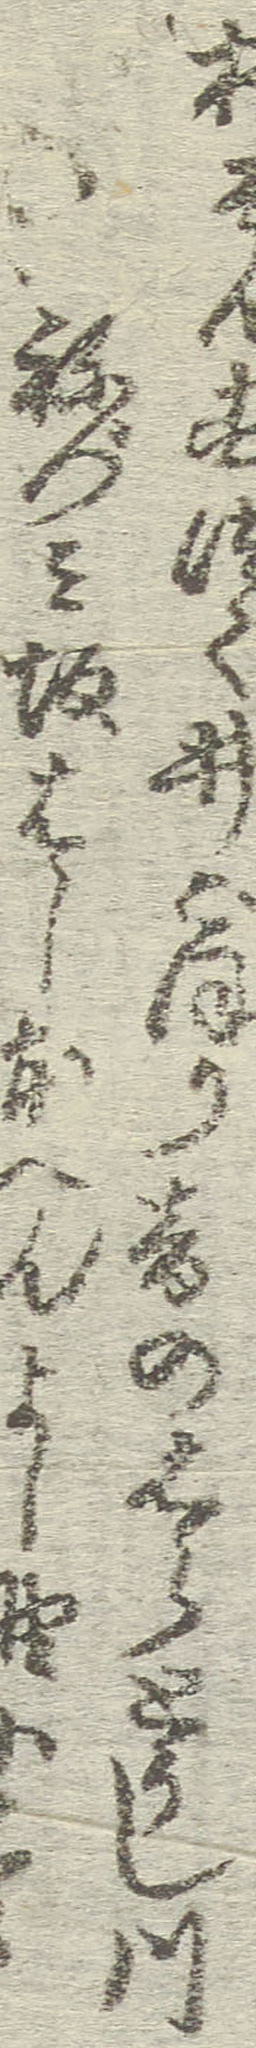ねづみ坂はし本へんよし野小はら
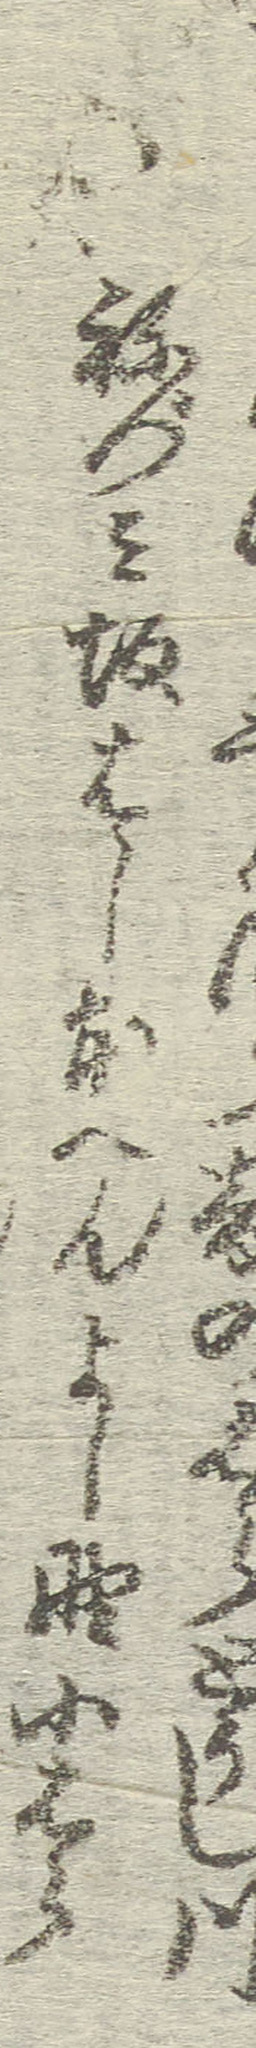ねづみ坂はし本へんよし野小はら
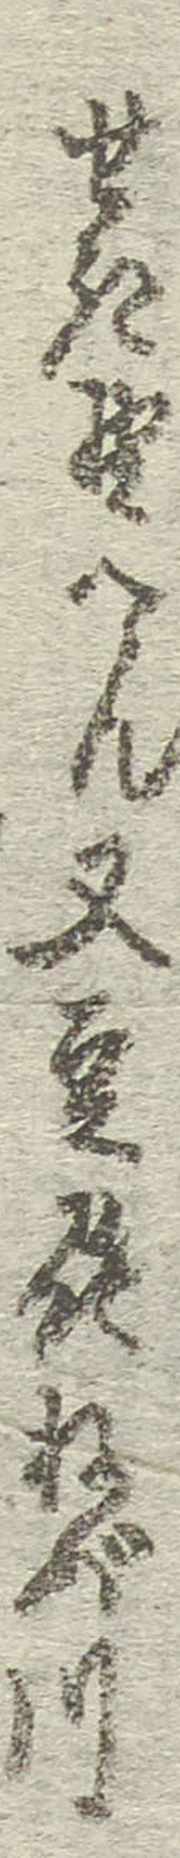せき野へん又豆州ねぶ川
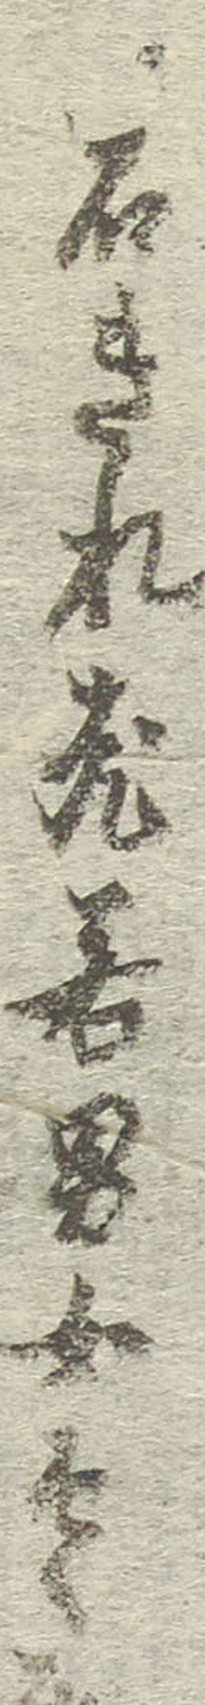石きれ老若男女そく死
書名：伊豆下田小田原箱根大地震之図
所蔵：東京大学総合図書館 General Library in the University of Tokyo, JAPAN
